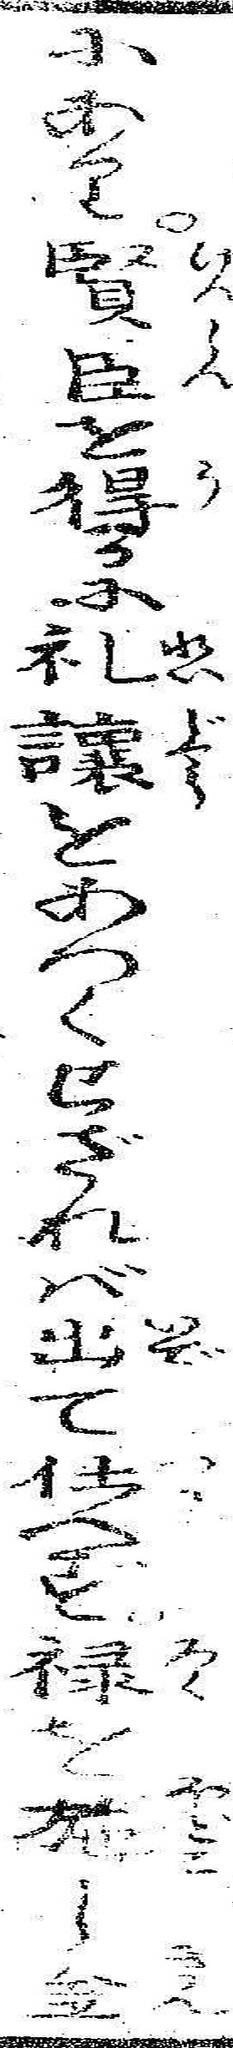にあり。賢臣を得るに礼譲をあつくせざれば出て仕へず。禄を施し金
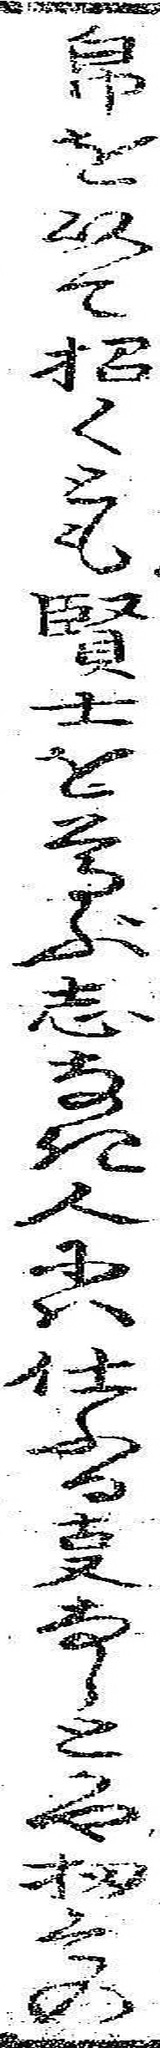帛を以て招くとも。賢士を尊ぶ志なき人には仕ふる事なしとかや。扨その
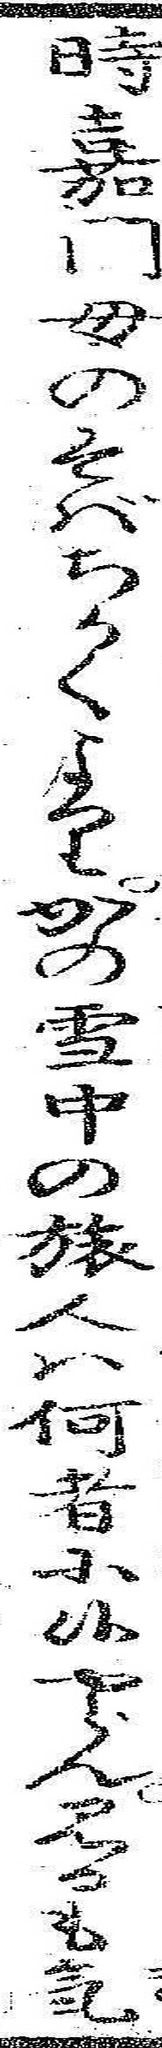時嘉門母のそばちかくより。かの雪中の旅人は何者に候やらん。見るも気
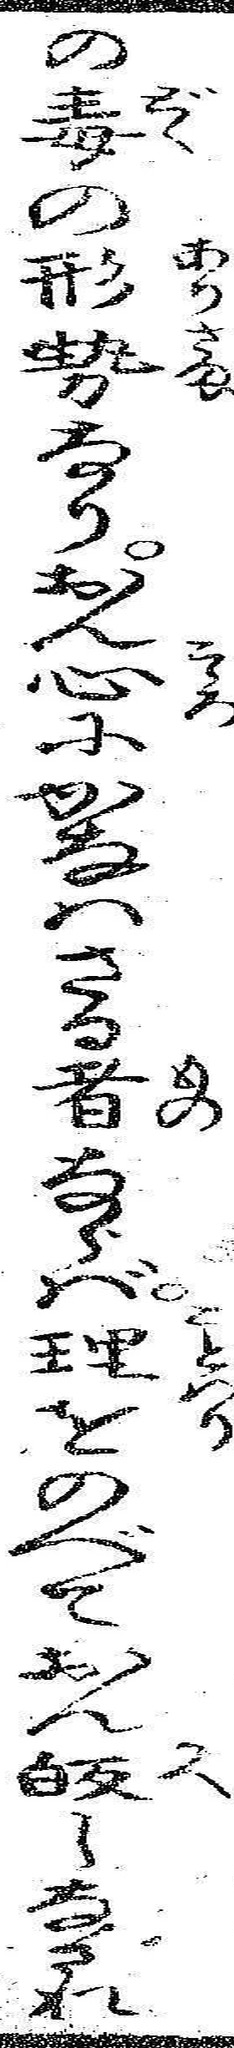の毒の形勢なり。おん心にかなはさる者ならば。理をのべておん帰しなされ
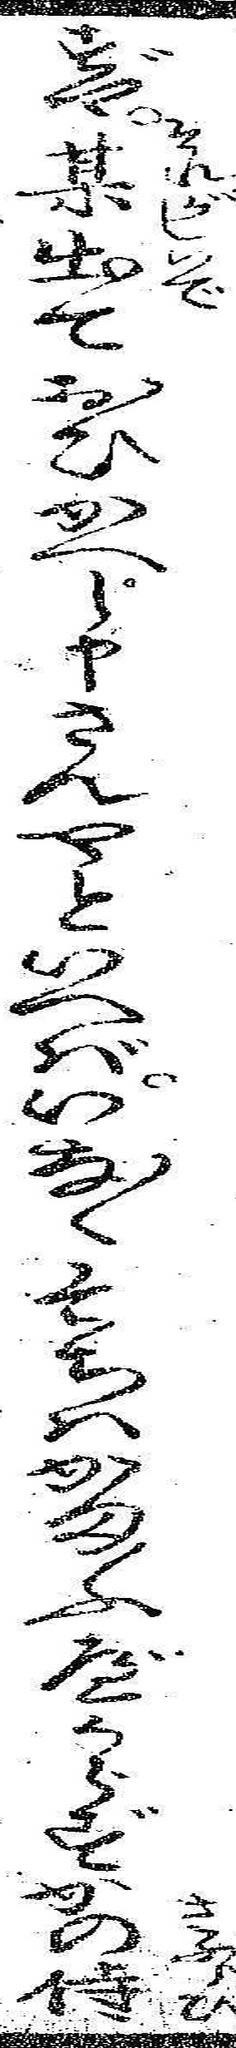ずや。某出ておひかへし申さんやといへば。いな〳〵そちはかまふべからずかの侍
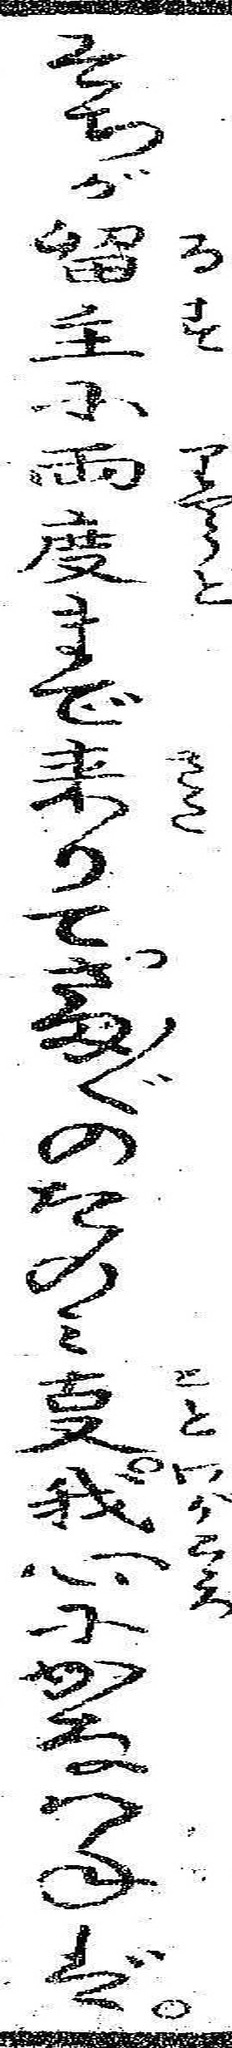そちが留主に両度まで来りて。さま〴〵のたのみ事。我心にかなはねば。

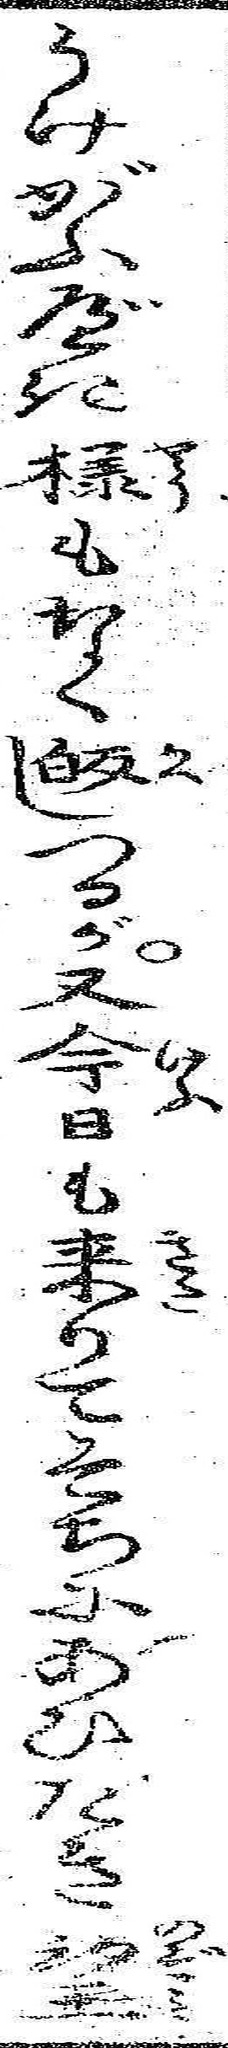うけがふべき様もなく帰しつるが。又今日も来りてそちにあひたき望
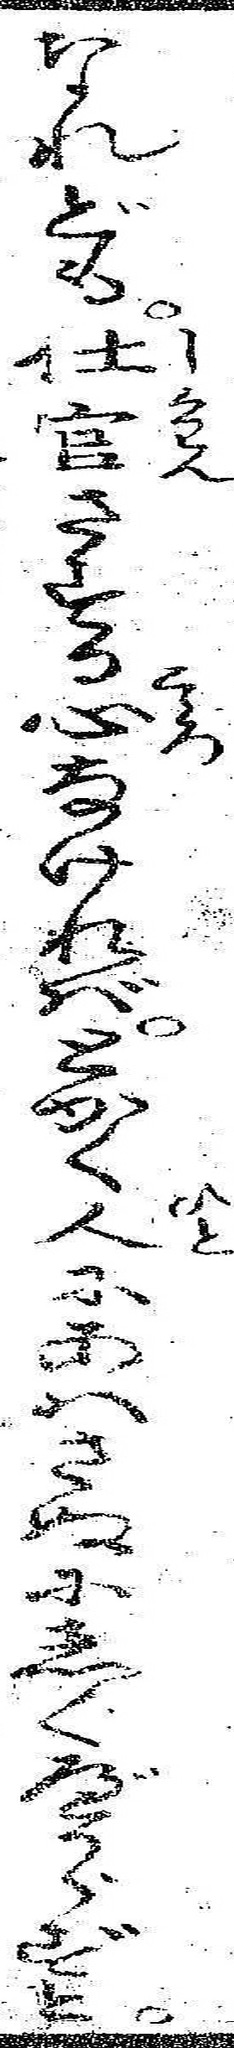なれども。仕官さする心なければ。とかく人にあはさぬにしくべからずと。
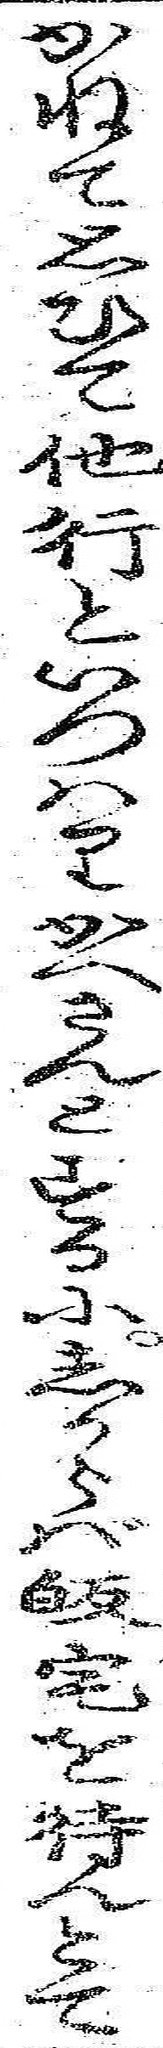かねて思ひて。他行といつはりかへさんとするに。しからば帰宅を待んとて
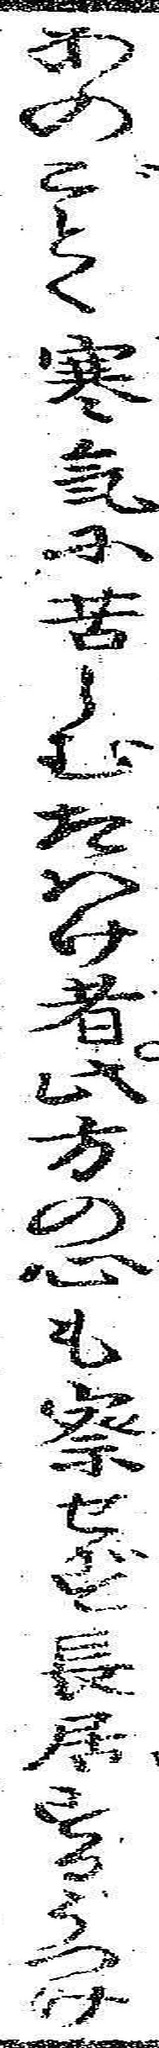あのごとく寒気に苦しむたはけ者。此方の心も察せず長居するうつけ
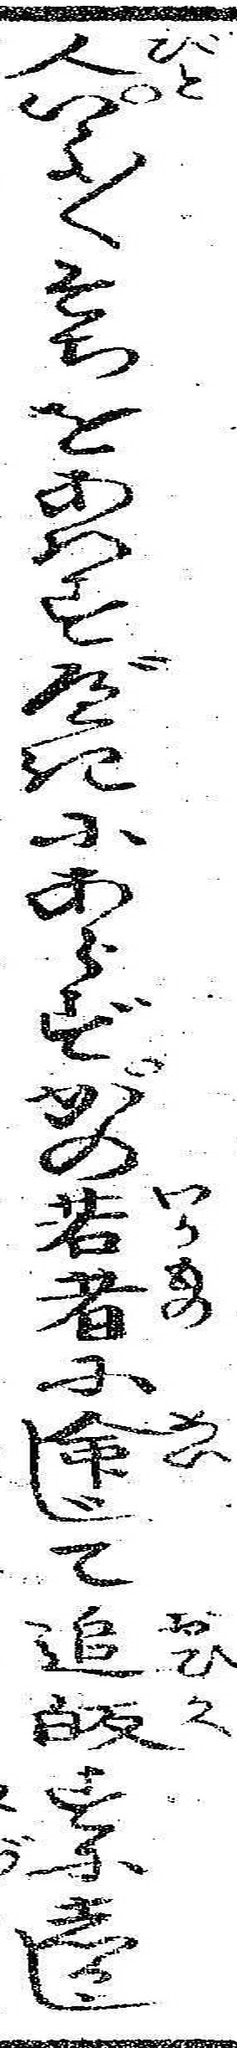人。いよ〳〵そちをあはすべきにあらず。かの若者に命じて追帰すにしかじ
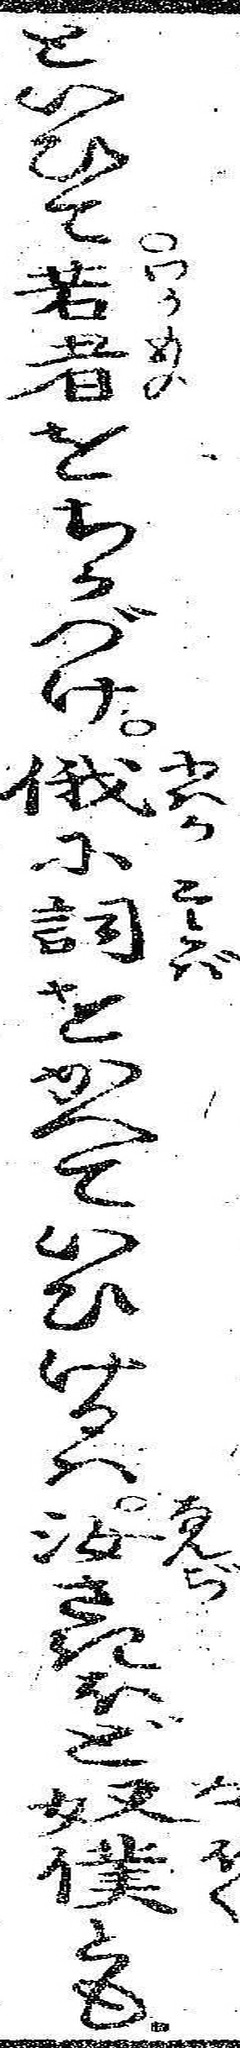といひて。若者をちかづけ。俄に詞をかへていひけるは。汝さきほど奴僕とも
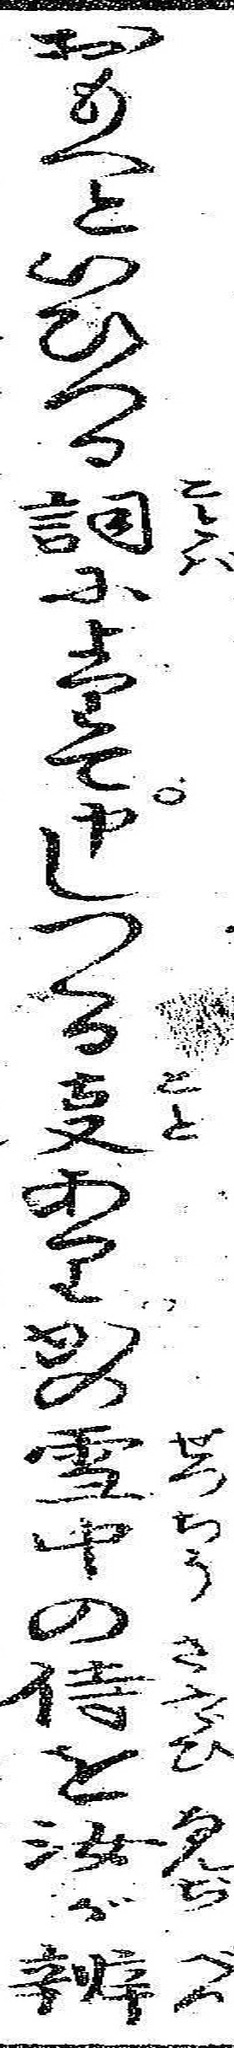おもへといひつる詞によりて。申しつくる事あり。かの雪中の侍を汝が弁
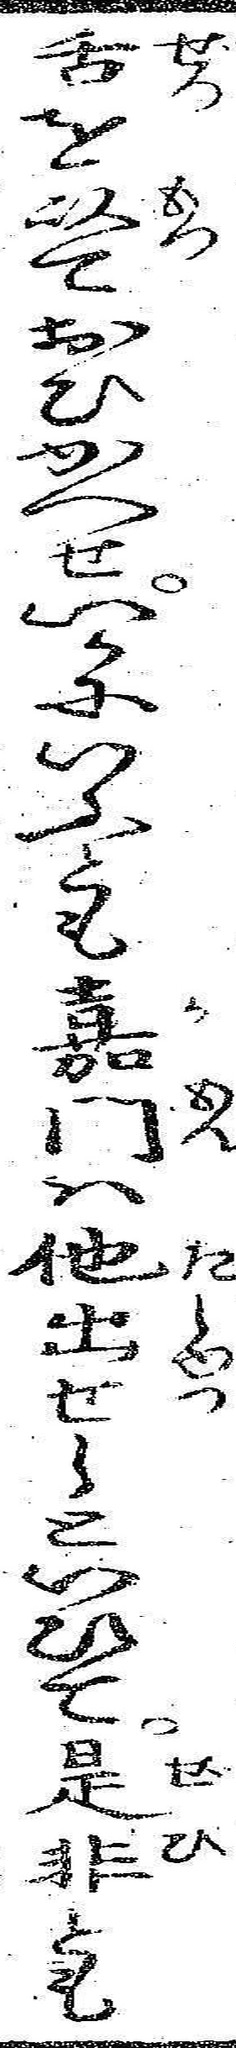舌を以ておひかへせ。いかにいふとも嘉門は他出せしといひて。是非とも
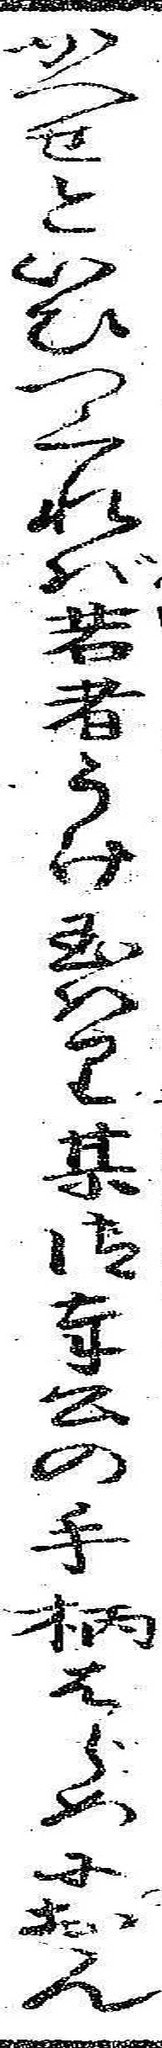かへせといひつくれば。若者うけ玉はり。某御奉公の手柄はじめに。おん
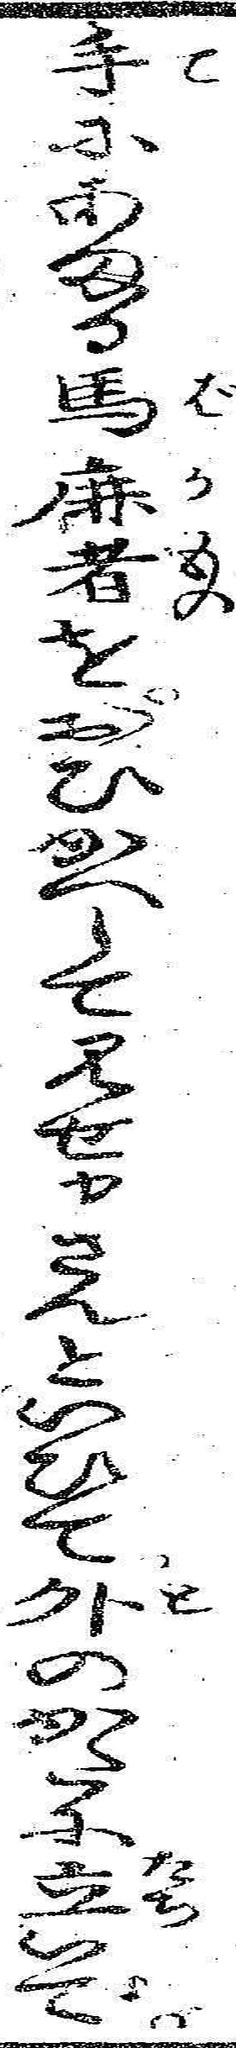手にあまる馬鹿者を。おひかへして見せ申さんといひて。外のかたに立いで。
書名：昔話稲妻表紙
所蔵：国文学研究資料館
